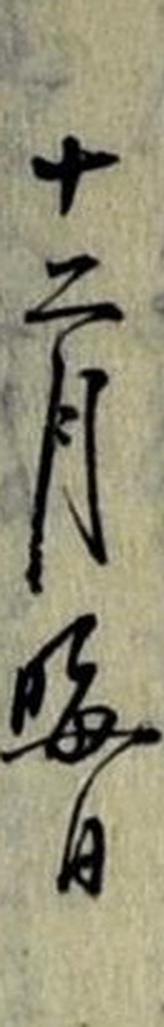十二月晦日
